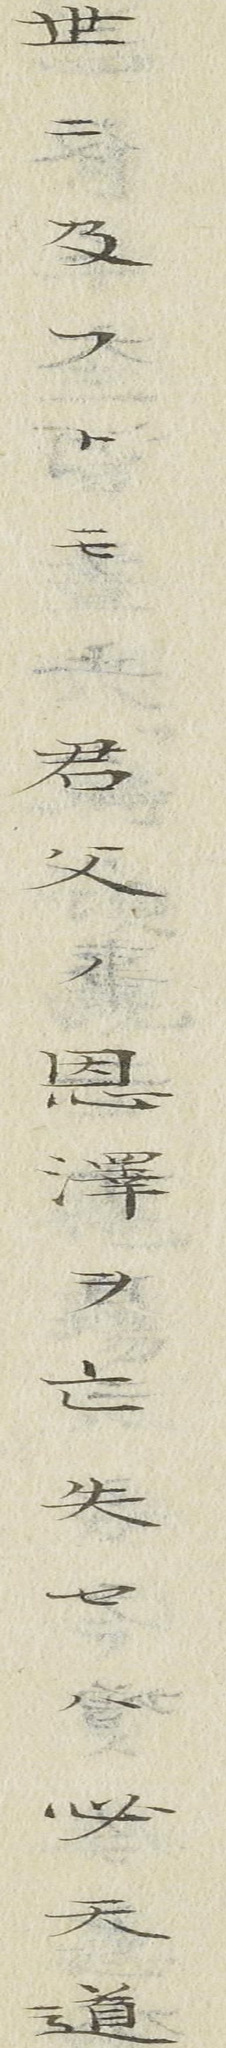世ニ及フトモ君父ノ恩沢ヲ亡失セハ必天道
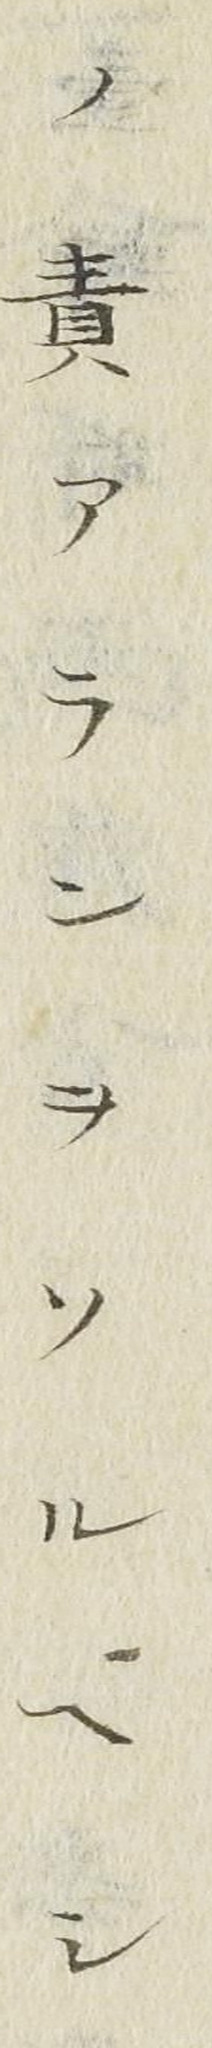ノ責アランヲソルヘシ
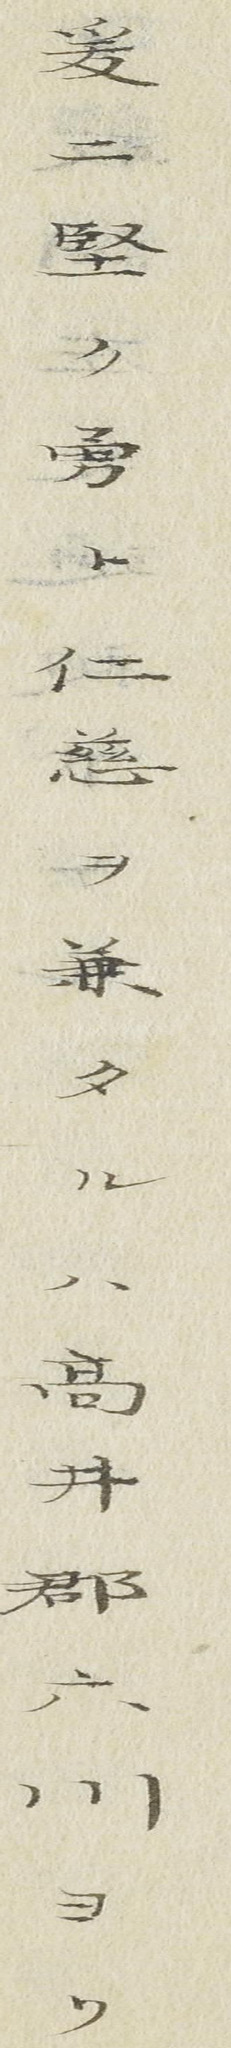爰ニ堅ク勇ト仁慈ヲ兼タルハ高井郡六川ヨリ
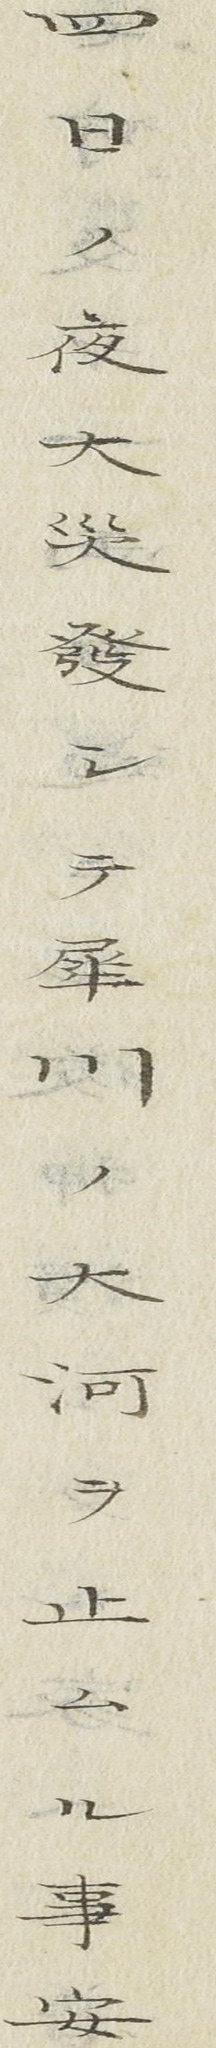四日ノ夜大災発シテ犀川ノ大河ヲ止ムル事安
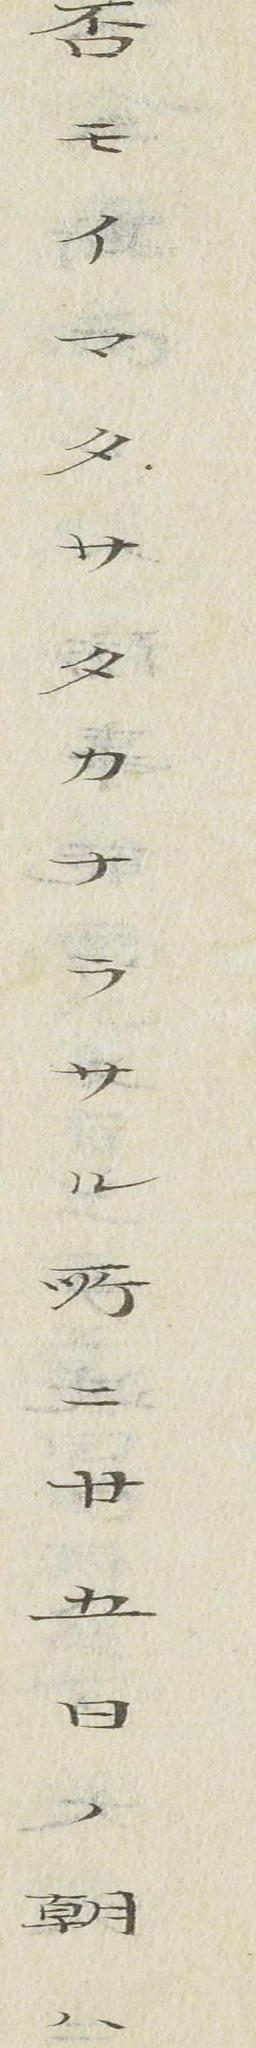否モイマタサタカナラサル所ニ廿五日ノ朝ハ
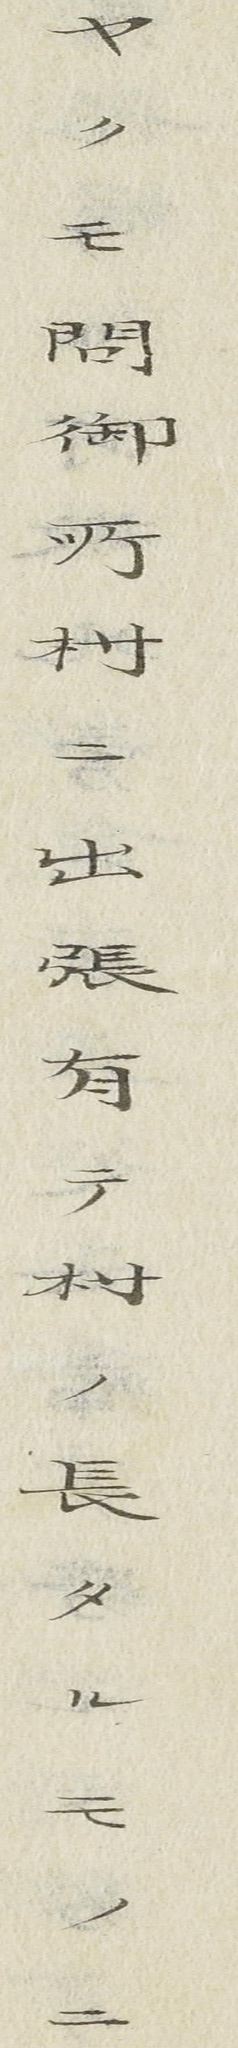ヤクモ問御所村ニ出張有テ村ノ長タルモノニ
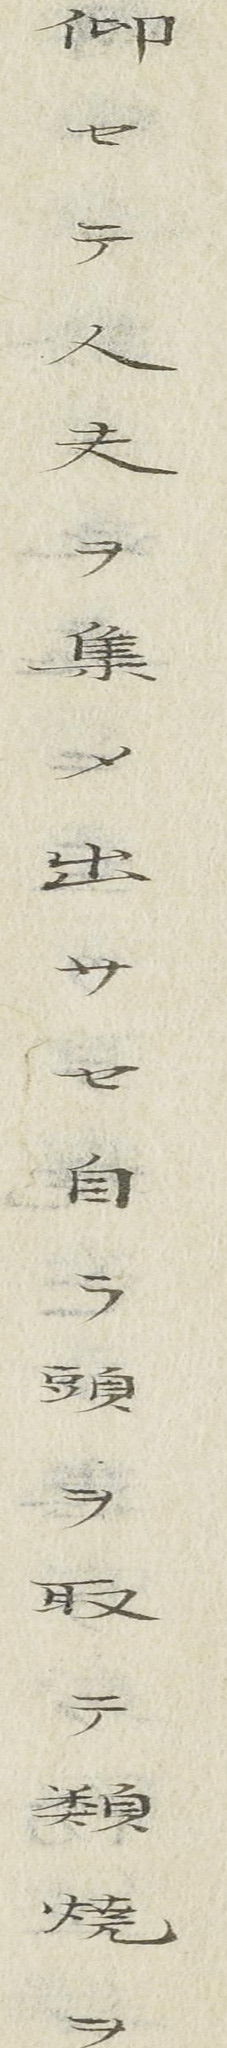仰セテ人夫ヲ集メ出サセ自ラ頭ヲ取テ類焼ヲ
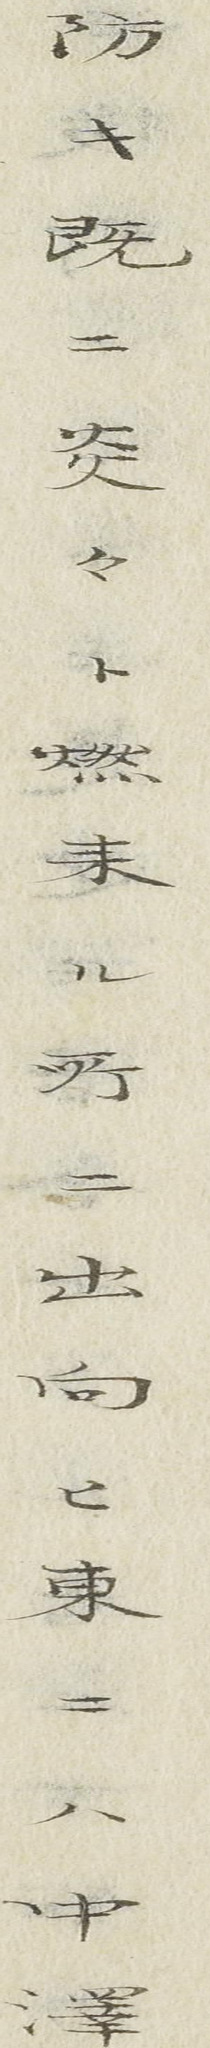防キ既ニ炎々ト燃来ル所ニ出向ヒ東ニハ中沢
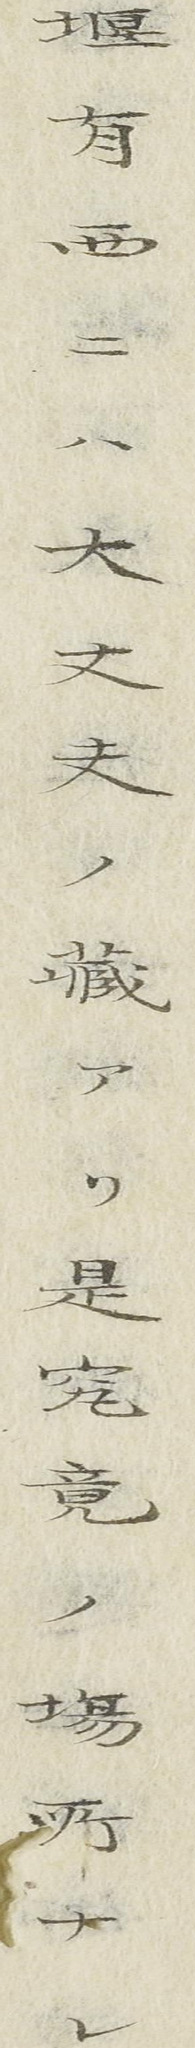堰有西ニハ大丈夫ノ蔵アリ是究竟ノ場所ナレ
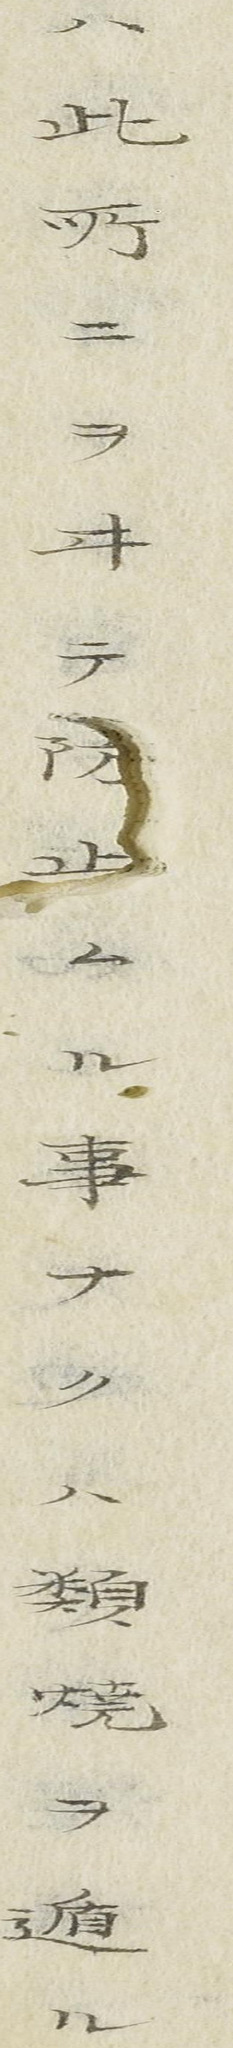ハ此所ニヲヰテ防止ムル事ナクハ類焼ヲ遁ル

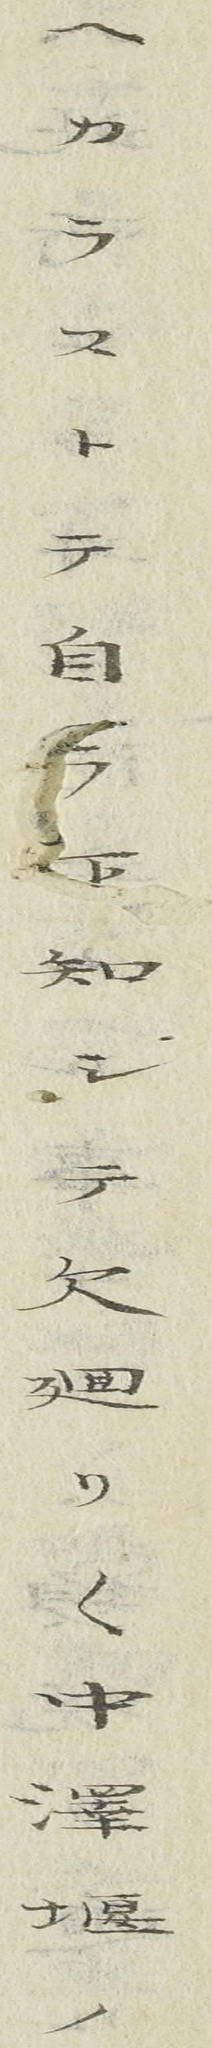ヘカラストテ自ラ下知シテ欠廻リ〱中沢堰ノ
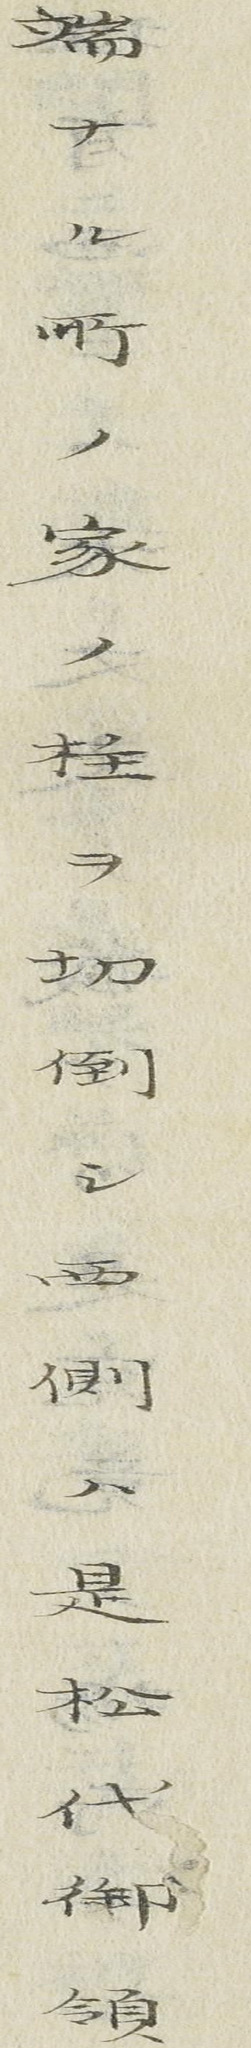端ナル所ノ家ノ柱ヲ切倒シ西側ハ是松代御領
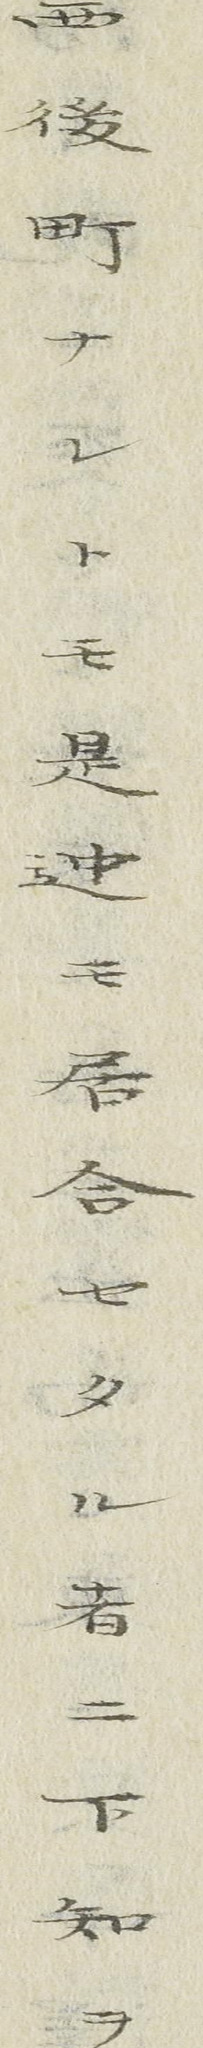西後町ナレトモ是迚モ居合セタル者ニ下知ヲ
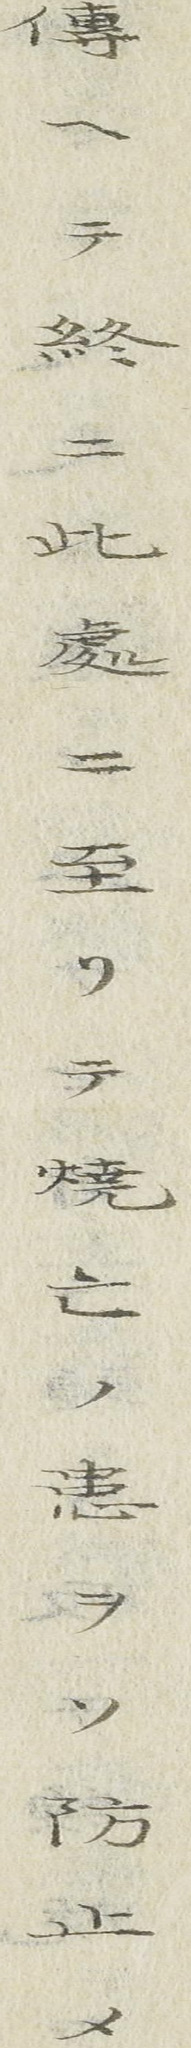伝ヘテ終ニ此処ニ至リテ焼亡ノ患ヲソ防止メ
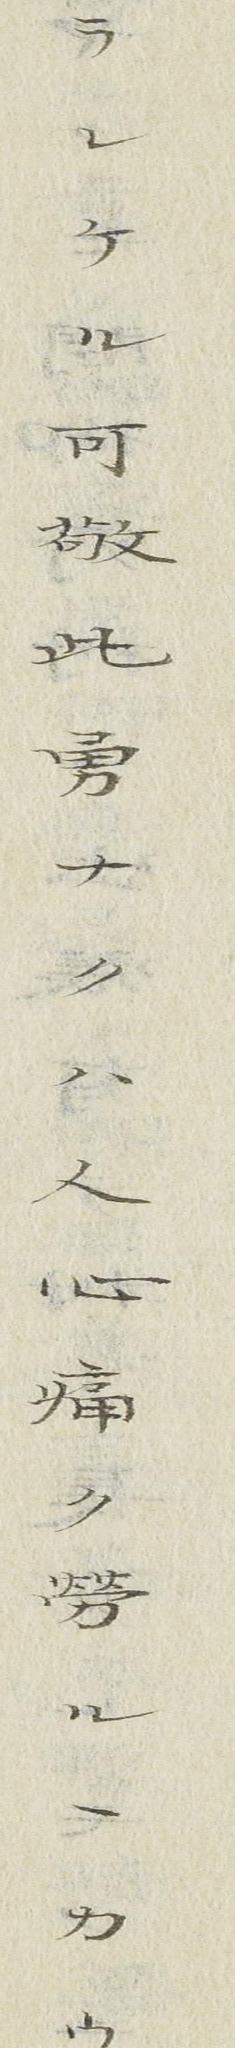ラレケル可敬此勇ナクハ人心痛ク労ルヽカウ
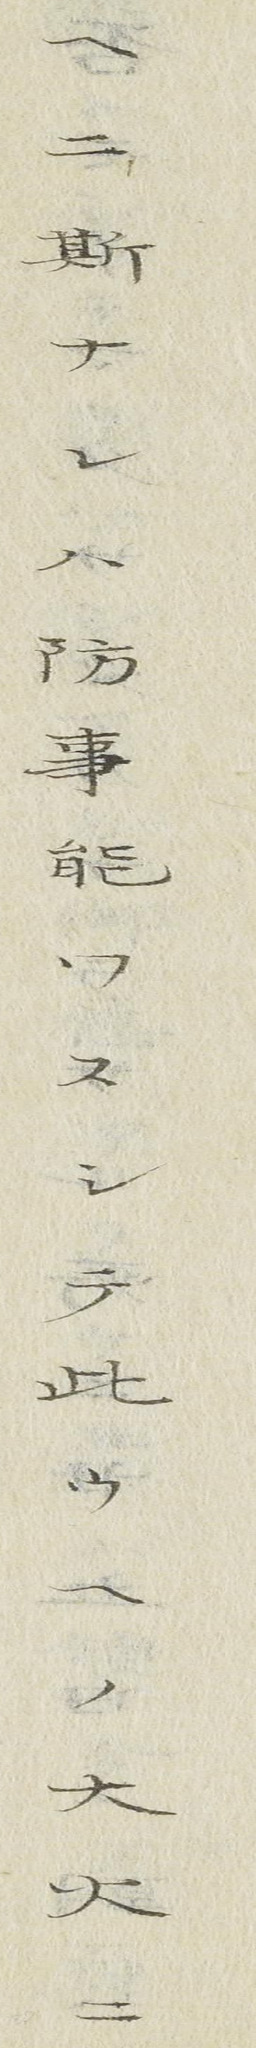ヘニ斯ナレハ防事能ワスシテ此ウヘノ大火ニ
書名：地災撮要　地震之部　巻ノ二
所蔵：東京大学地震研究所図書室 Earthquake Research Institute Library, The University of Tokyo, JAPAN
